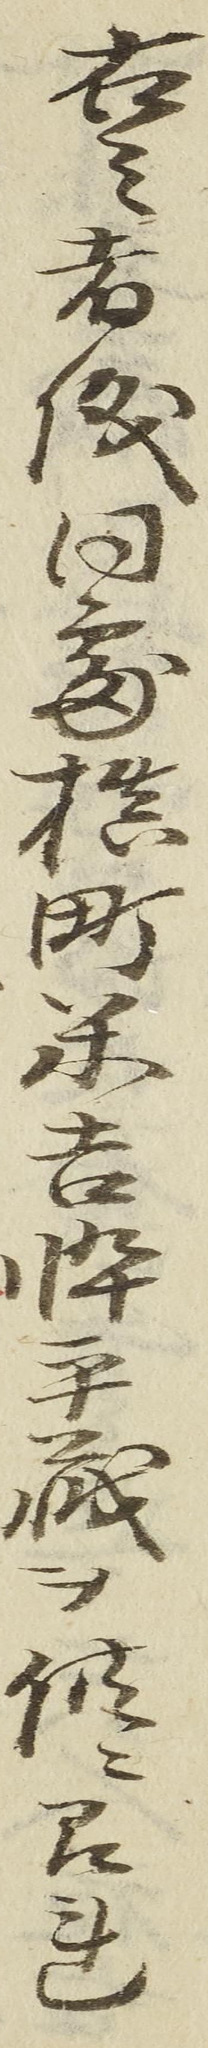右之者儀同処槇町米吉忰平蔵ヲ供二召連
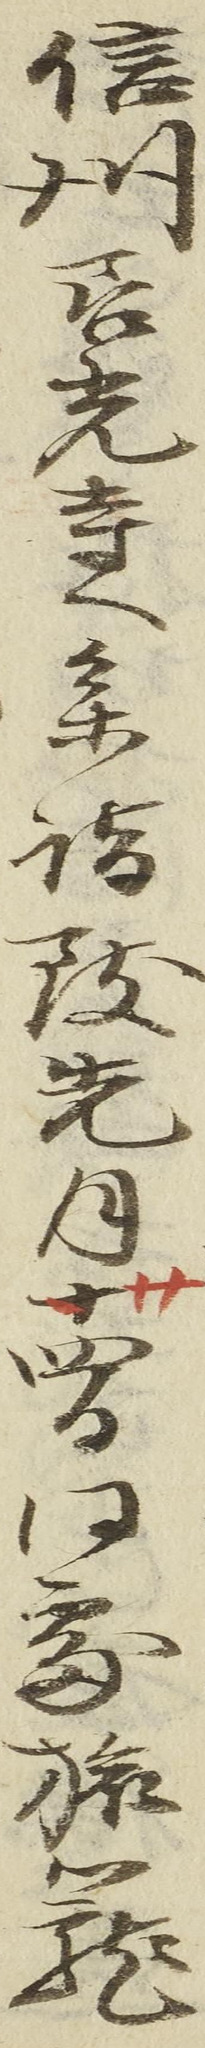信州善光寺へ参詣致先月廿四日同処旅籠
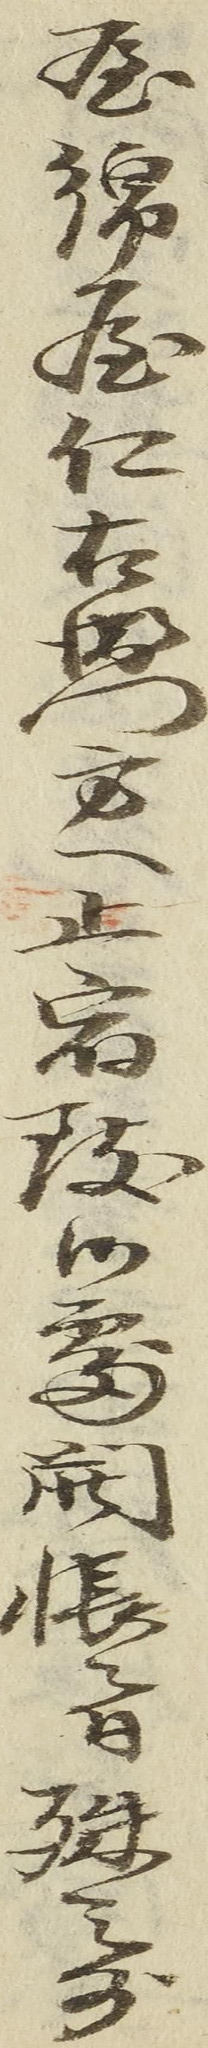屋綿屋仁右衛門方へ止宿致候処開帳二付殊之外
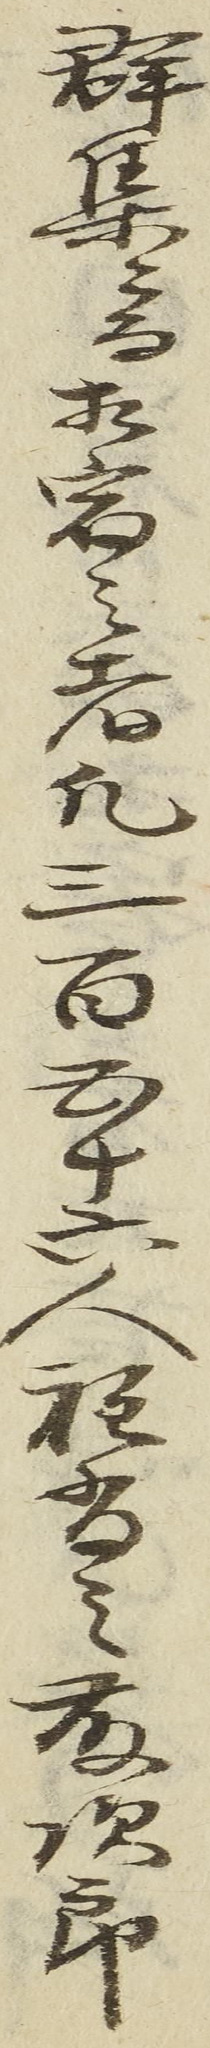群集二而相宿野者凡三百五十六人程有之藤次郎
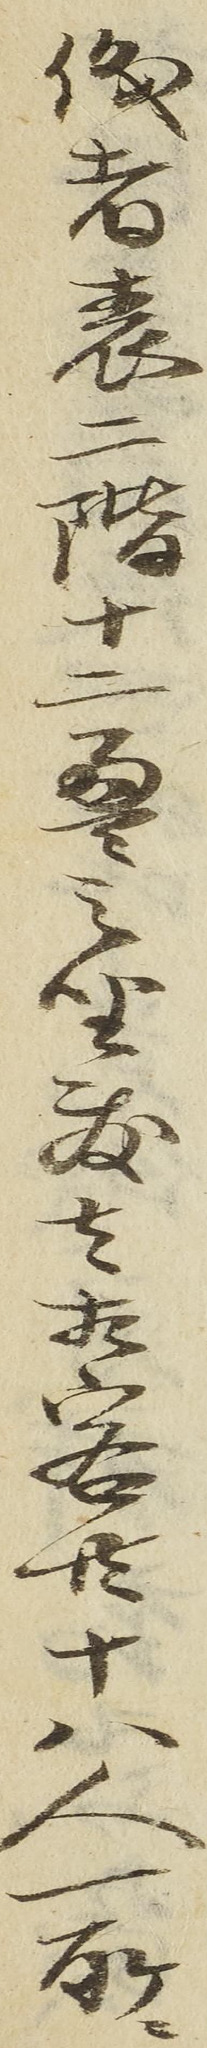儀は表二階十二畳之坐敷は相客廿八人一所二

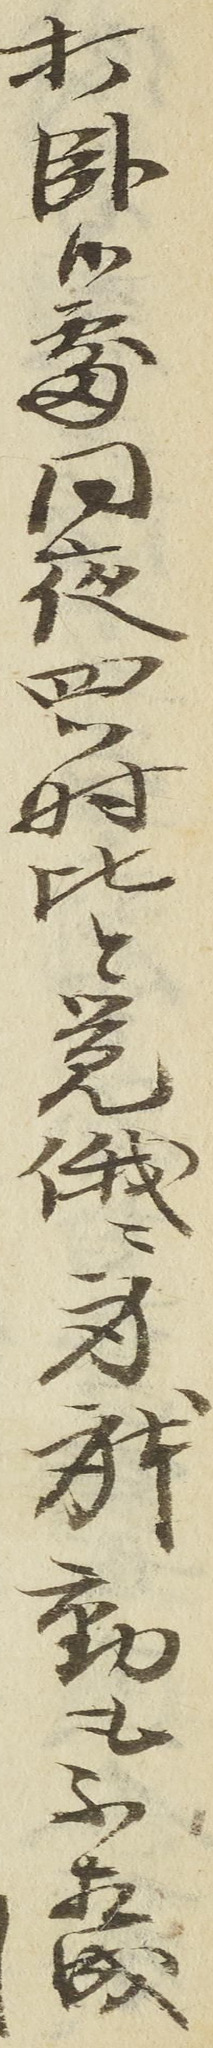打臥候処同夜四ッ時比と覚俄二身体動も不相成
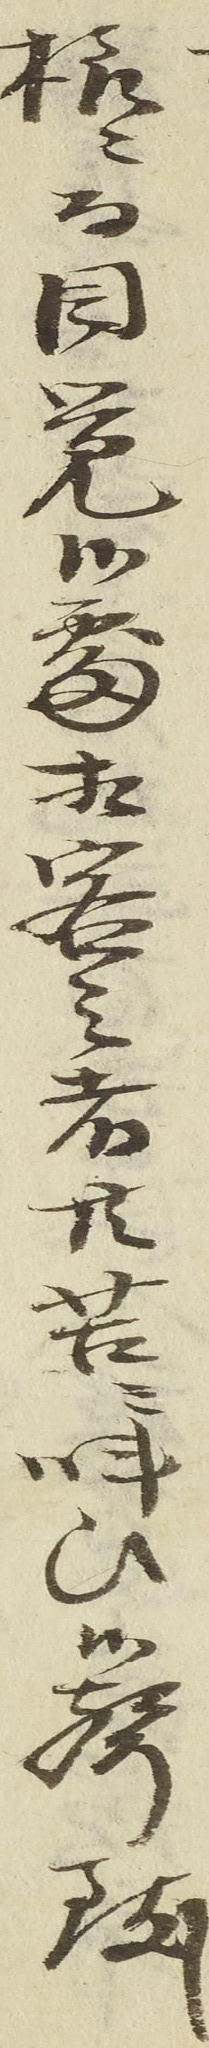様二而目覚候処相客の者共苦二叫ひ候声致し
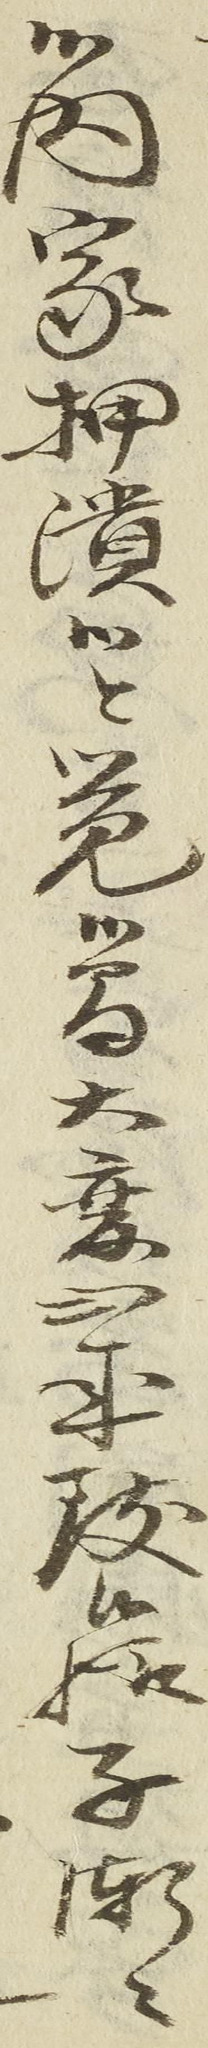候内家押潰候と覚候間大変出来致候様子漸々
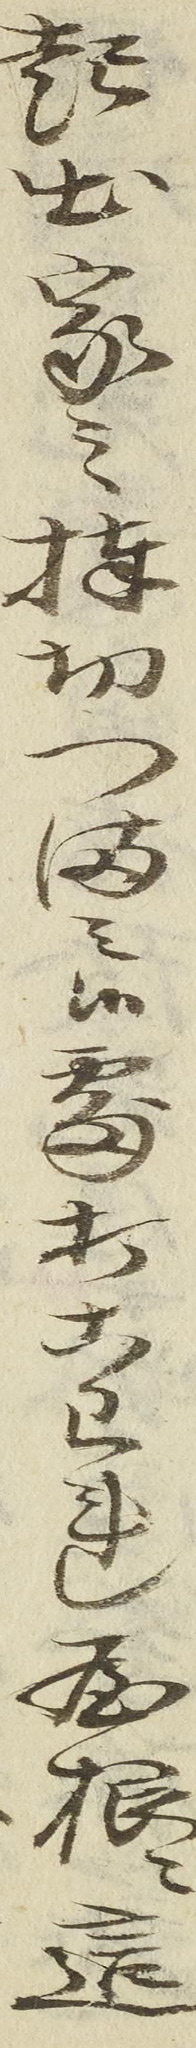起出家之棟切つまみ候処打こわれ屋根二這
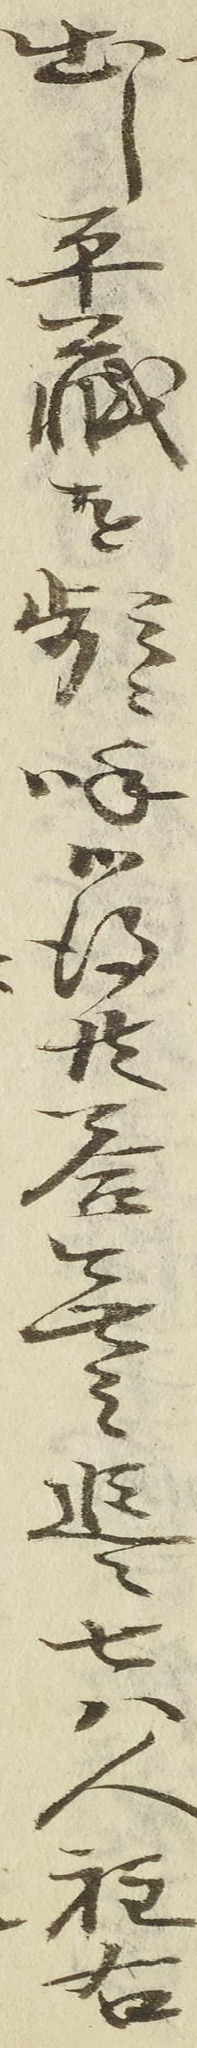出し平蔵を頻二呼候得共答無之追々七八人程右
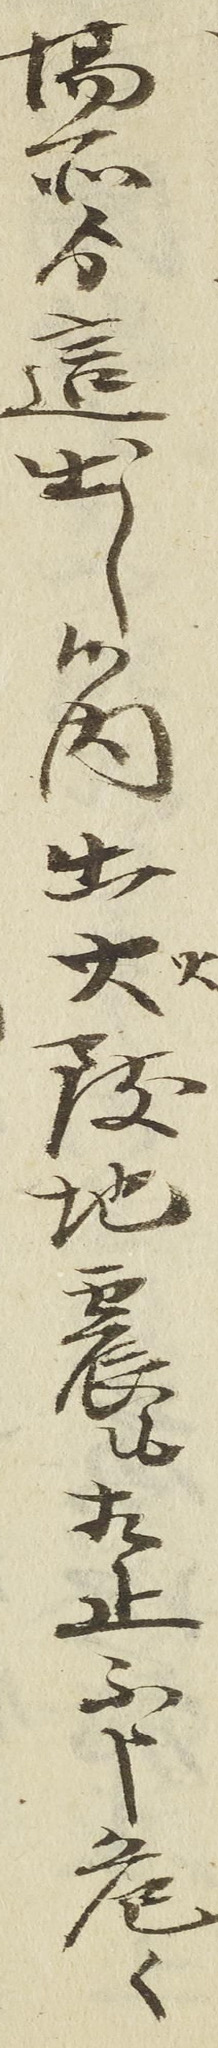場所ゟ這出し候内出火致地震も相止不申危く
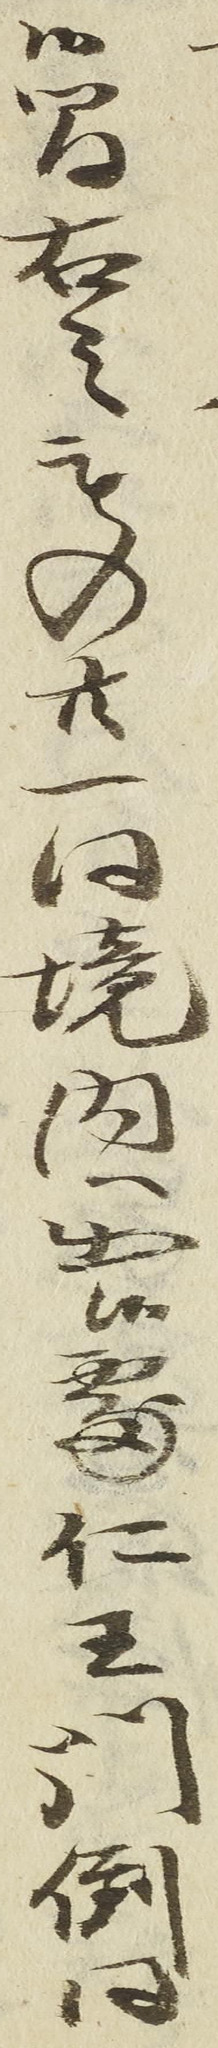候間右之もの共一同境内へ出候処仁王門倒同
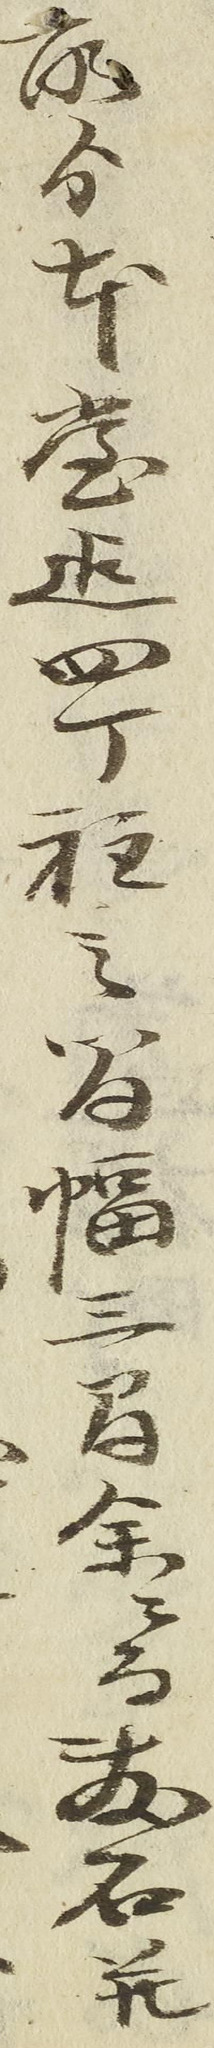処ゟ本堂迄四丁程之間巾三間余二而敷石并
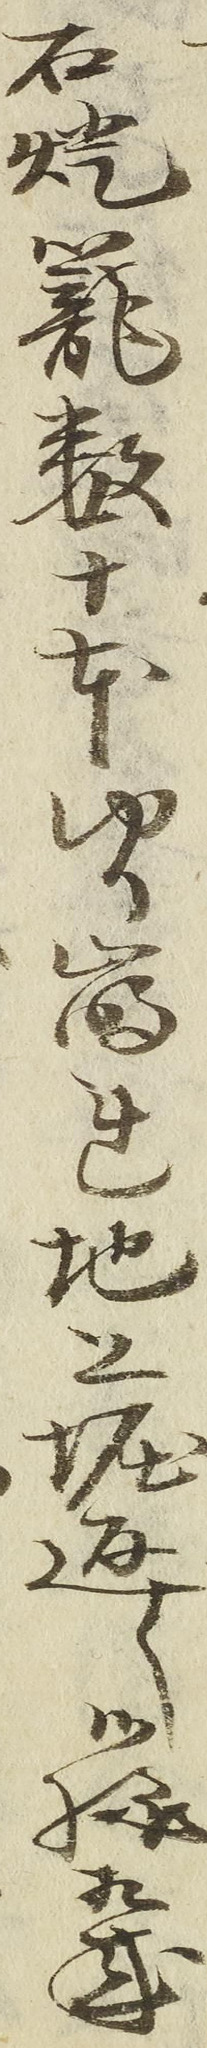石燈籠数十本ゆり崩れ地上堀返し候様相成
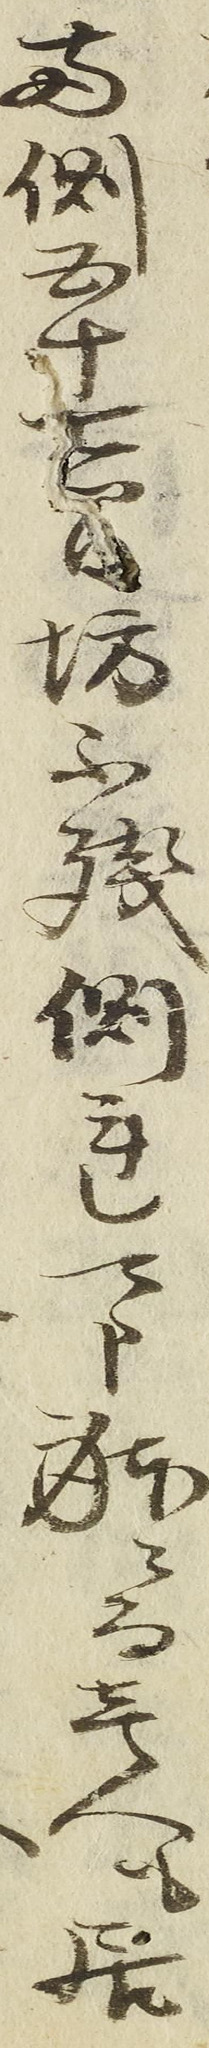両側五十七宿坊不残倒れ可申体二而壱人も居
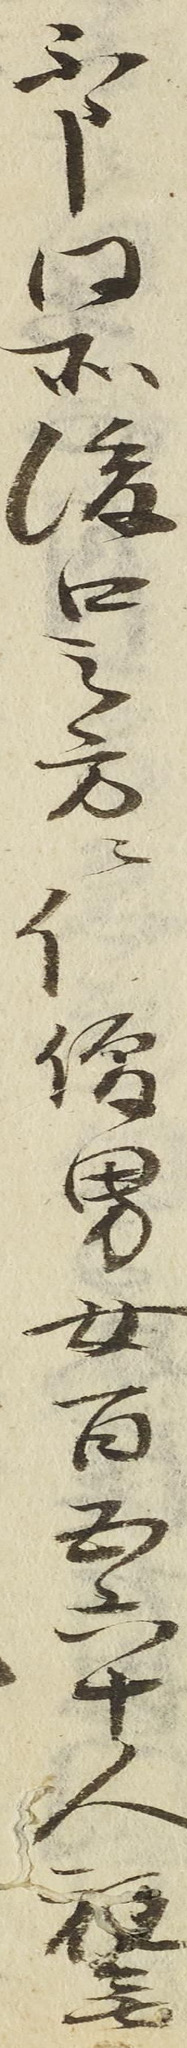不申同所後口之方二僧男女百五六十人程無
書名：信濃國大地震記　乾
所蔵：東京大学地震研究所図書室 Earthquake Research Institute Library, The University of Tokyo, JAPAN
